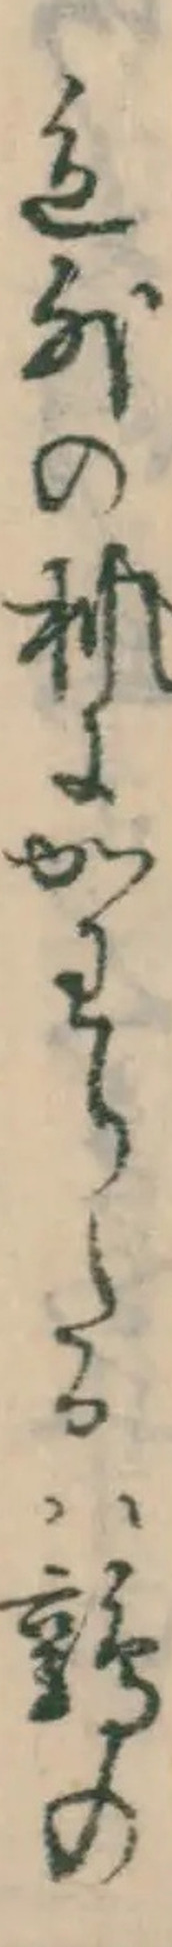色外の楓にかわりたるは鶉の
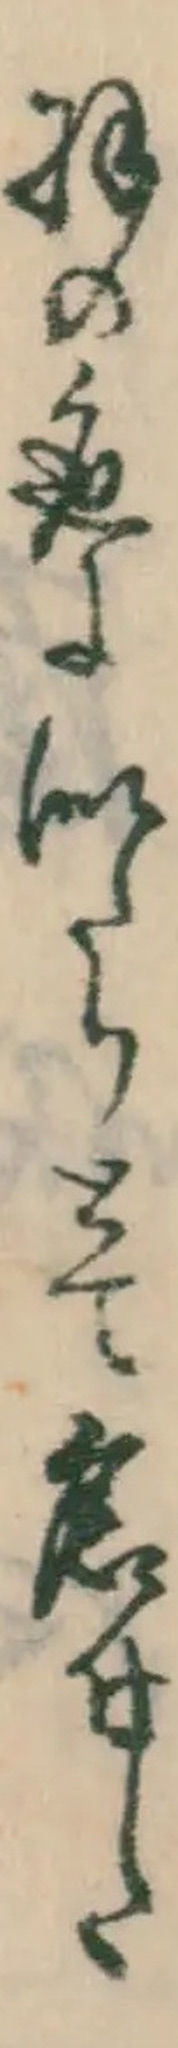羽の色に似たりとて名付た
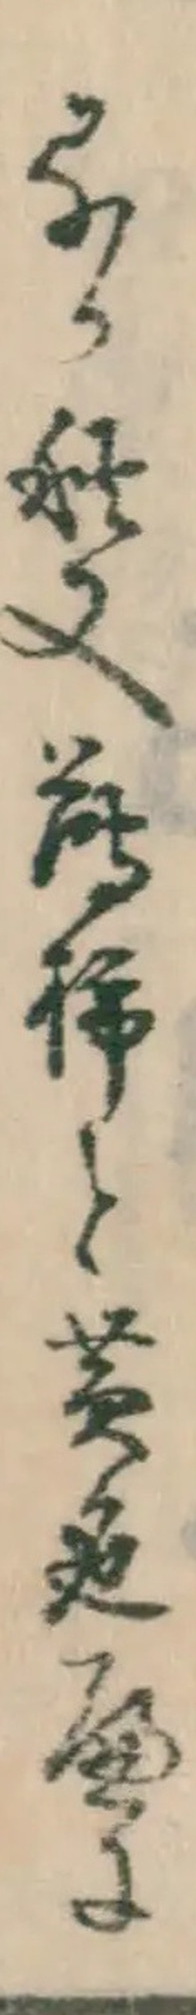るか秋又薄柿と黄色へに
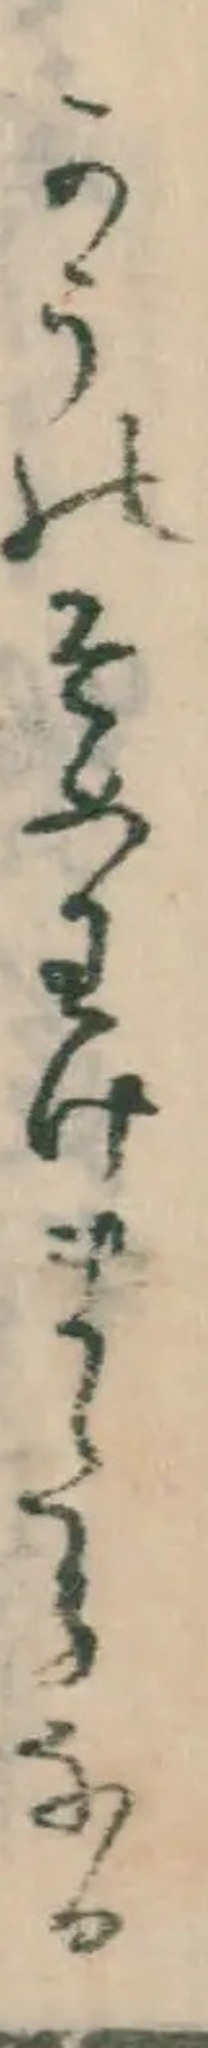かうのそめわけまたらなる
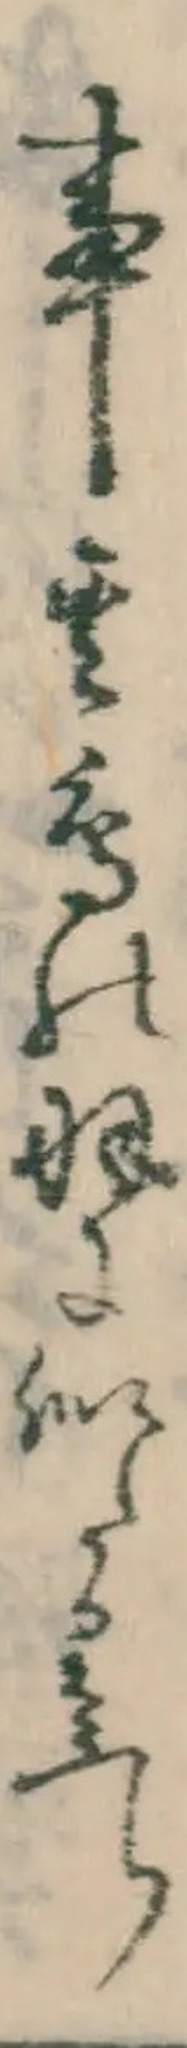事其鳥の羽に似たるとなり
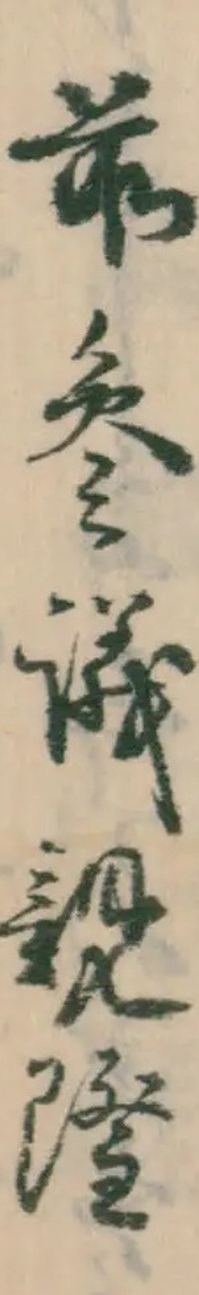前参議親隆
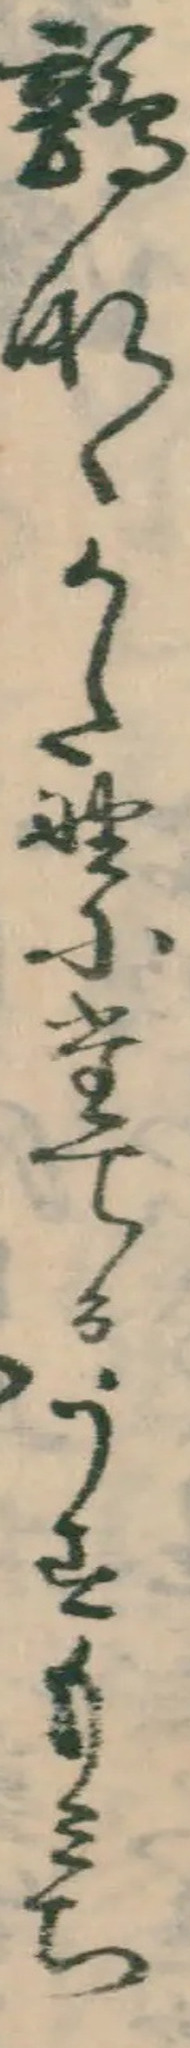鶉なくかた野にたてるうすもみち
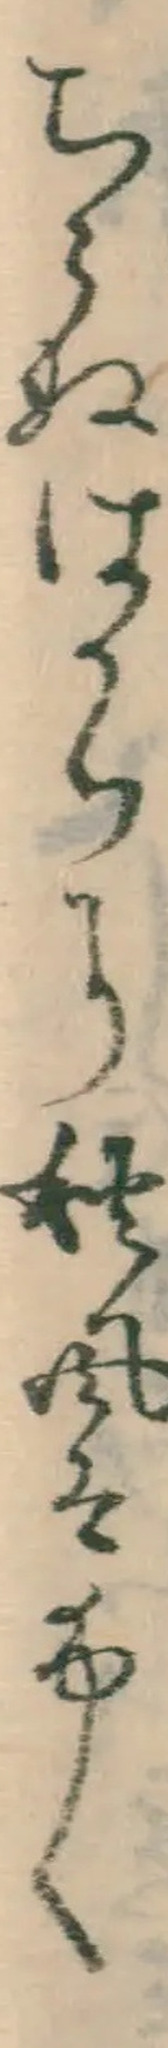ちらぬはかりに秋風そふく
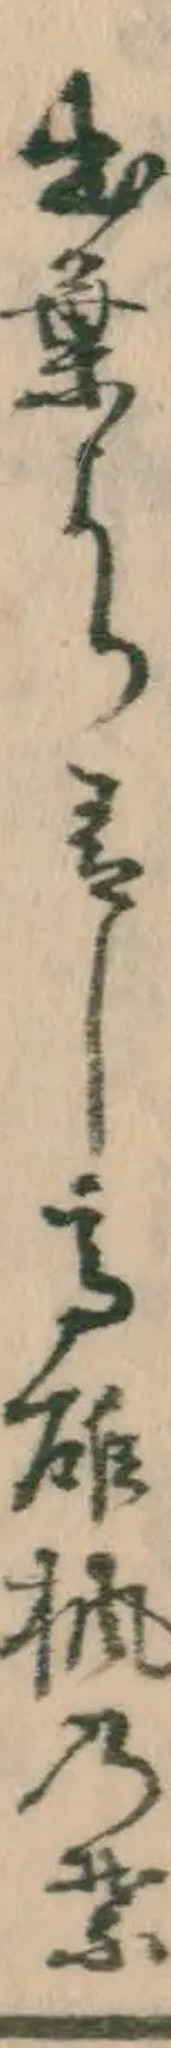出葉より青し高雄楓の葉
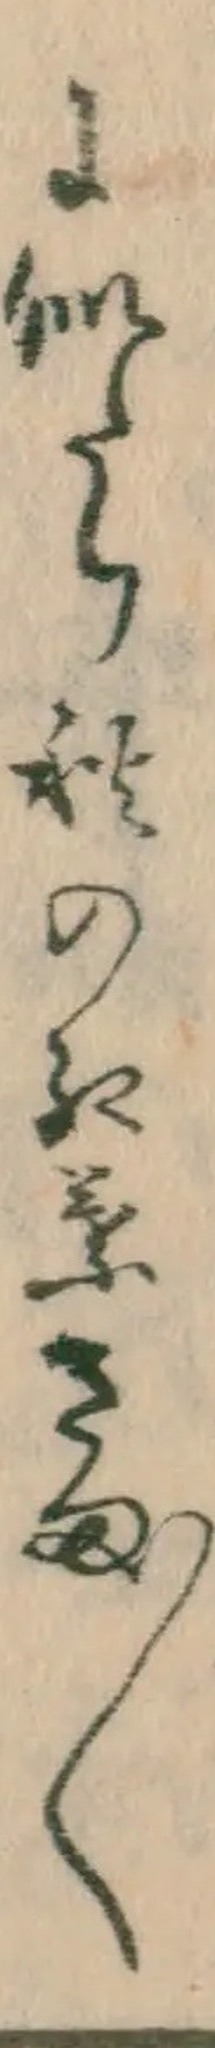に似たり秋の紅葉さま〳〵
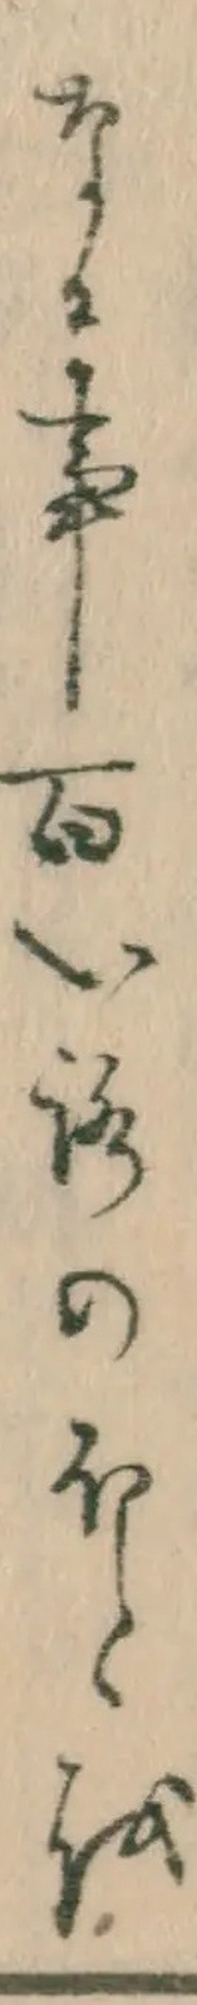なる事百いろのほとを
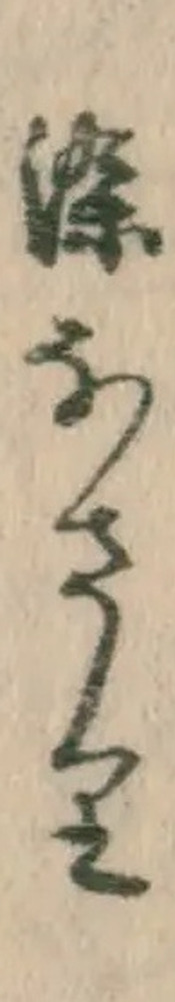染なさり
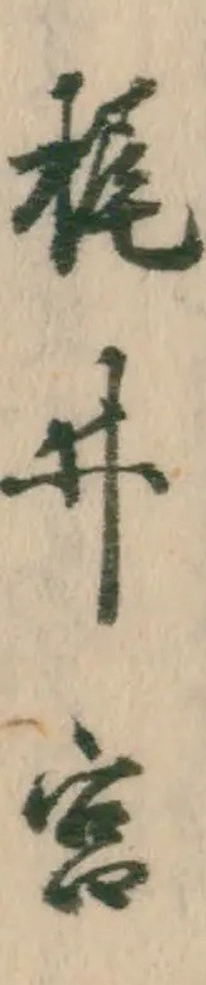梶井宮
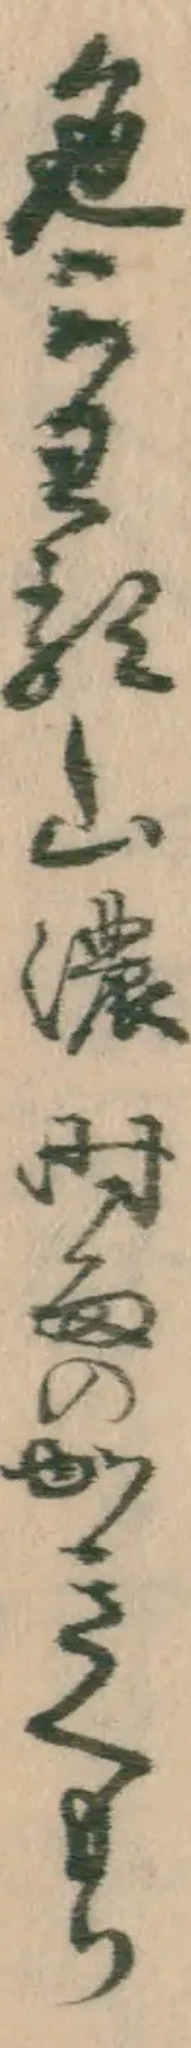色かわる山の時雨のかきくもり
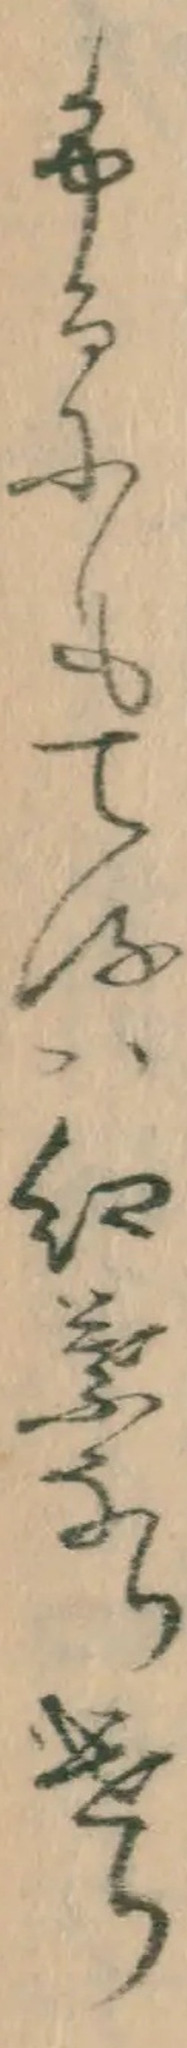ふるにもてるは紅葉なりけり

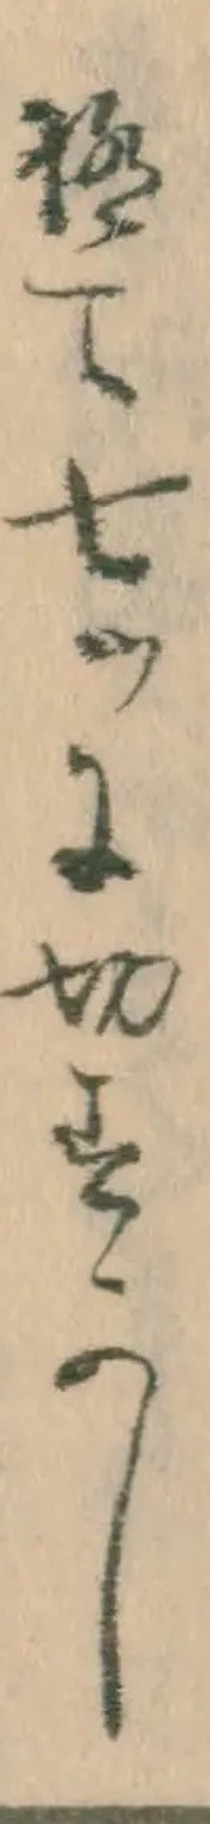極て七ッに切すかし
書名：紅葉集
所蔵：国立国会図書館 National Diet Library, JAPAN
